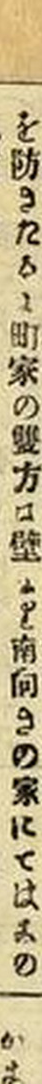を防きたるに町屋の雙方は壁なり南向きの家にてはこの
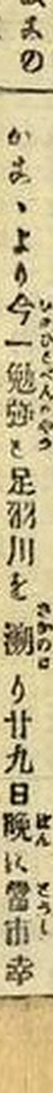かこゝより今一勉強と足羽川を遡り廿九日晩に當市幸
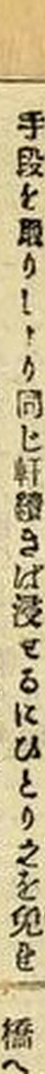手段を取りしゝり同じ軒續きは浸せるにひとり之を免れ
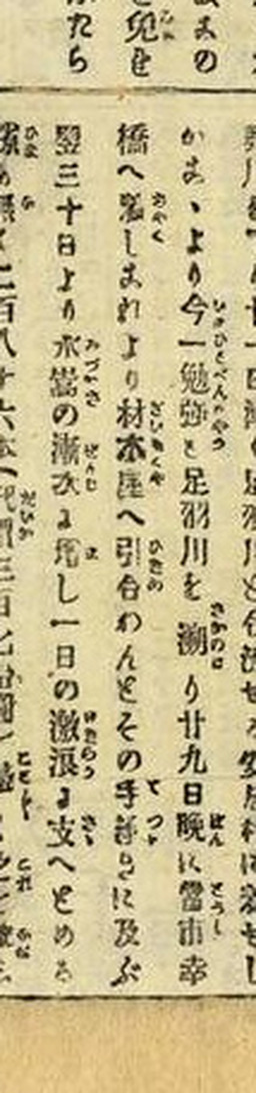橋へ着しこれより材木屋へ引合わんとその手續きに及ぶ
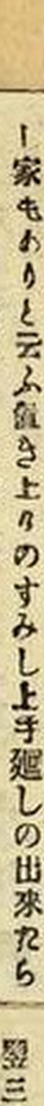し家もありと云ふ置き上けのすみし上手廻しの出來たら
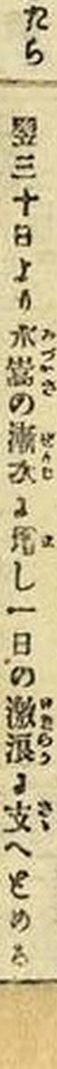翌三十日より水嵩の漸次に增し一日の激浪に支へとめる
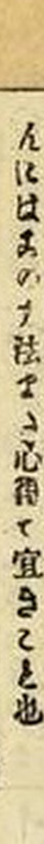んにはこの方法また心得て宜きこと也
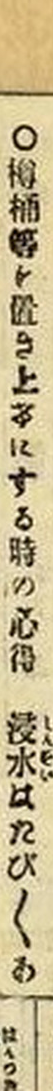○樽桶等を置き上けにする時の心得浸水はたび〴〵あ
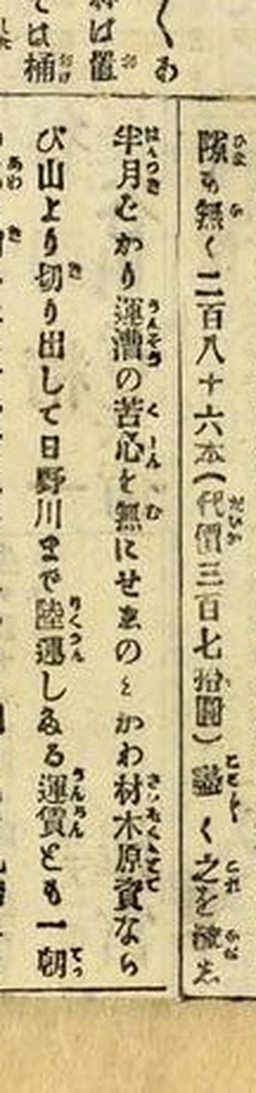半月ばかり運漕の苦心を無にせしのみかわ材木原資なら
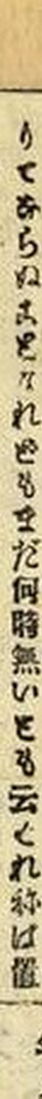りてならぬことなれどもまだ何時無いとも云はれねば置
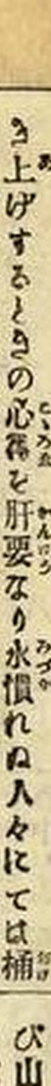き上げするときの心得そ肝要なり水慣れぬ人々にては桶
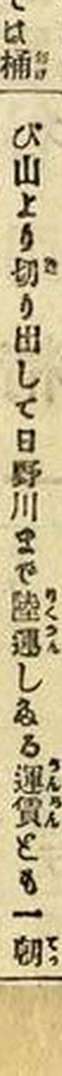び山より切り出して日野川まで陸運したる運賃とも一朝
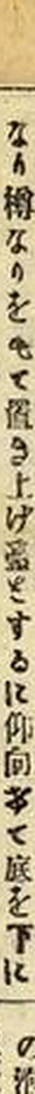なり樽なりをもて置き上げ臺とするに仰向けて底を下に
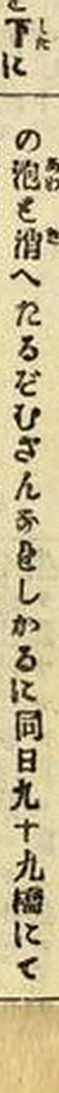の泡と消へたるぞむざんなれしかるに同日九十九橋にて
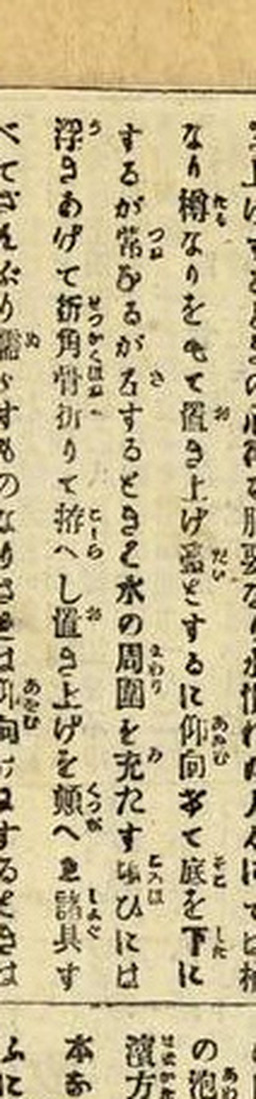するが常なるが左するときは水の周圍を充たす頃ひには
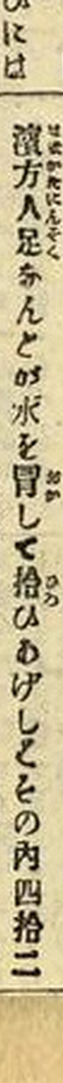濱方人足なんとが水を冒して拾ひあげしはその内四拾二
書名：温古集 五巻
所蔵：福井県文書館 Fukui Prefectural Archives
